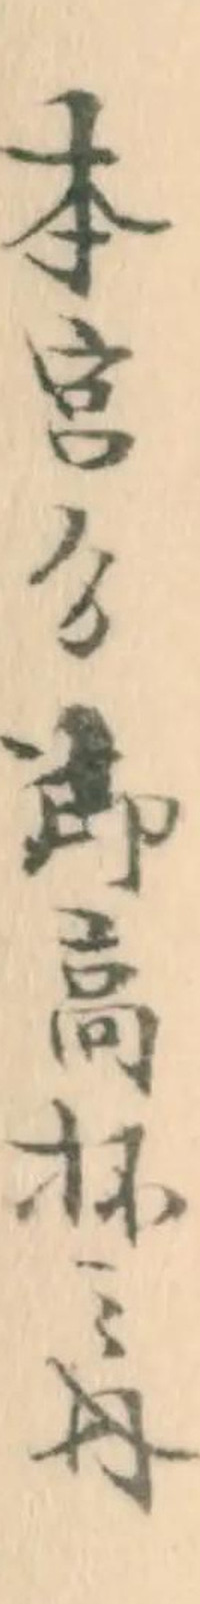本宮分御高杯之内
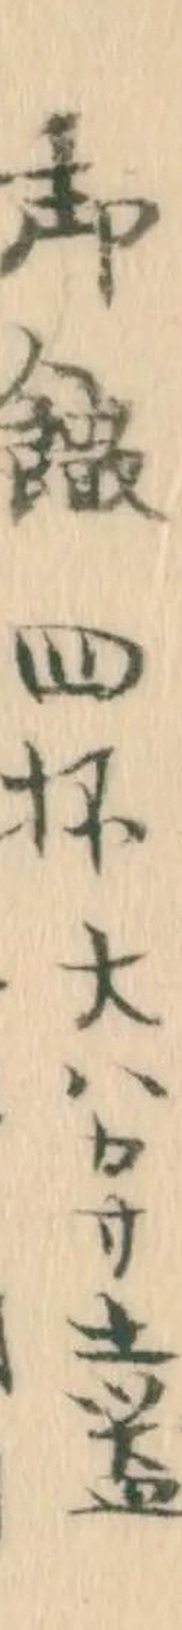御饊四杯大ハカサ土器
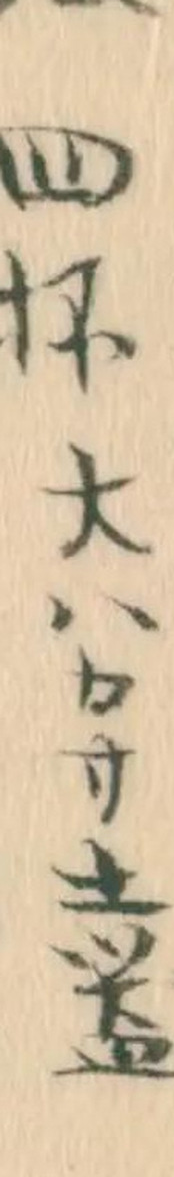御饊四杯大ハカサ土器
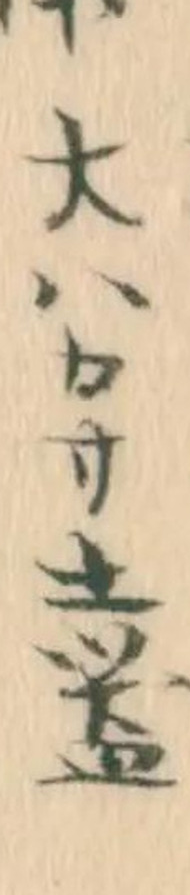大ハカサ土器
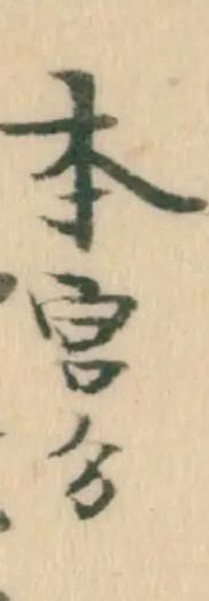本宮分
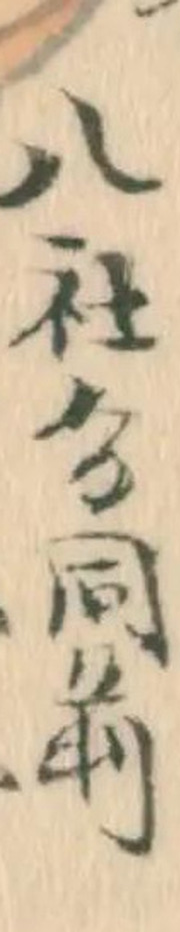八社分同前
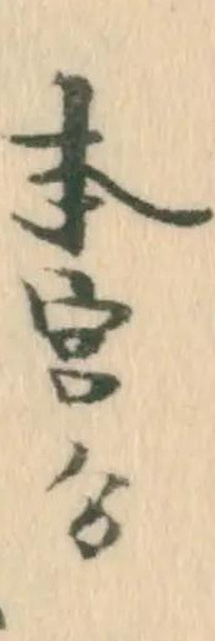本宮分
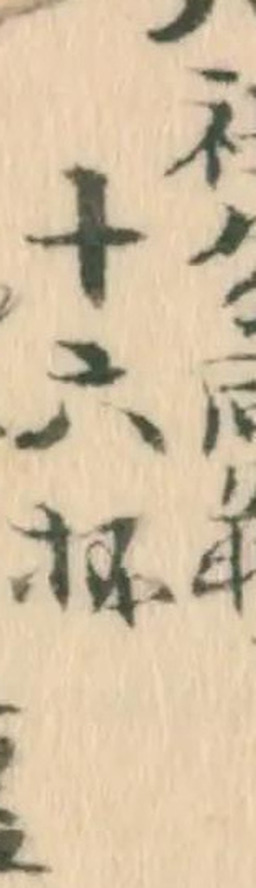十六杯
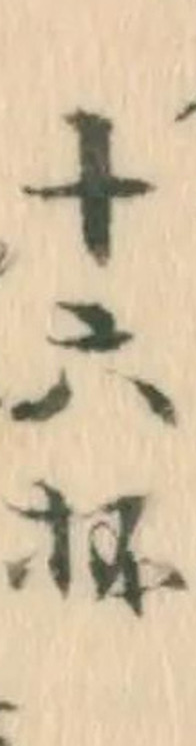十六杯
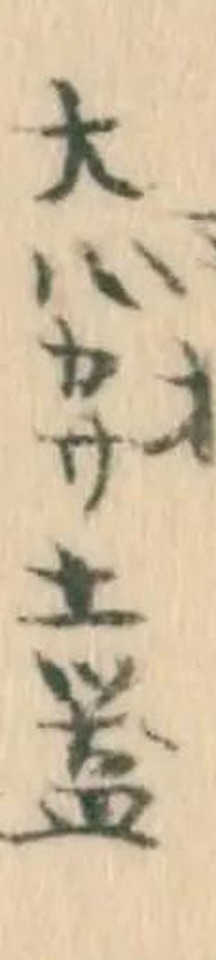大ハカサ土器
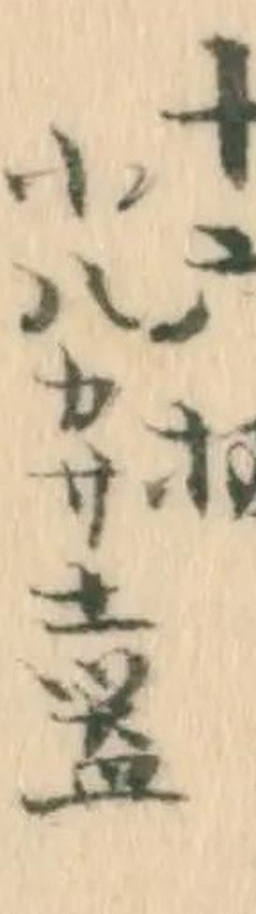小ハカサ土器
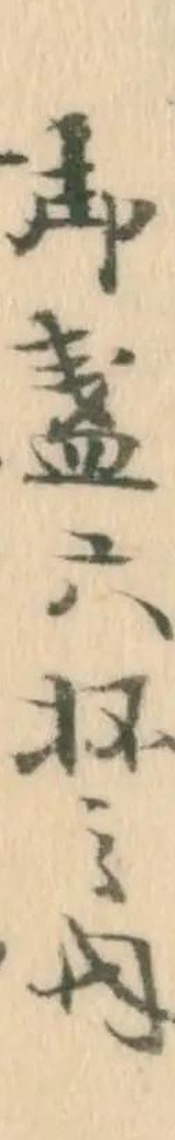御盞六杯之内
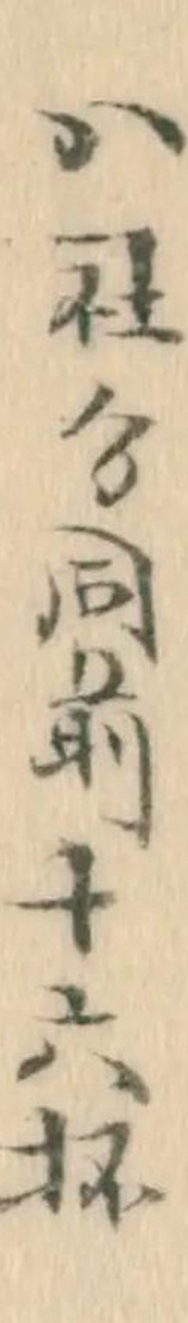八社分同前十六杯
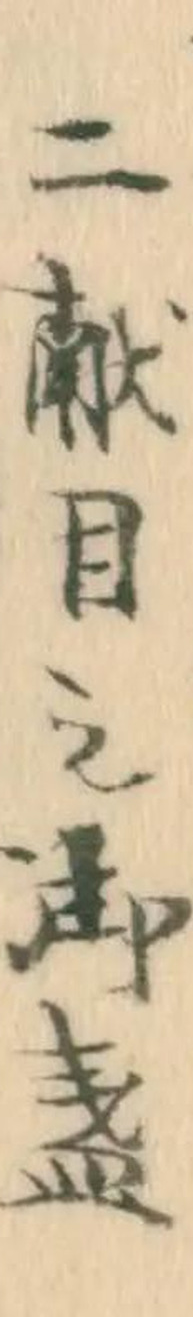二献目之御盞
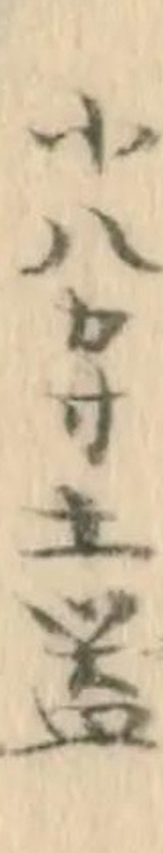小ハカサ土器
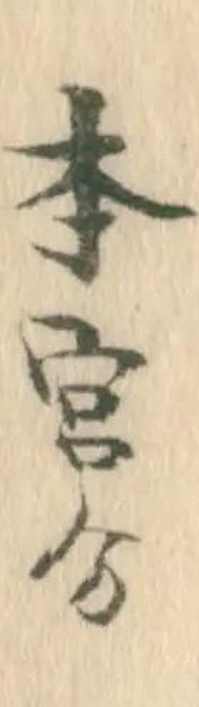本宮分
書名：葵御祭供進之神饌諸品色目書
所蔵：国立国会図書館 National Diet Library, JAPAN
